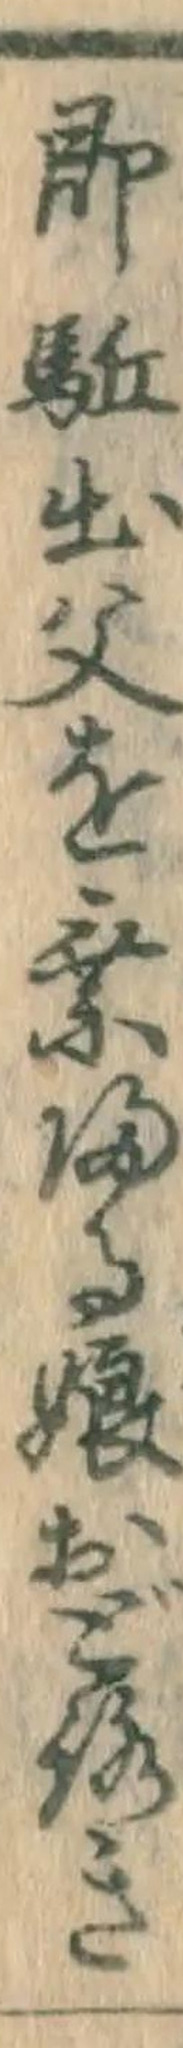即駈出父を乗帰る娘おどろき
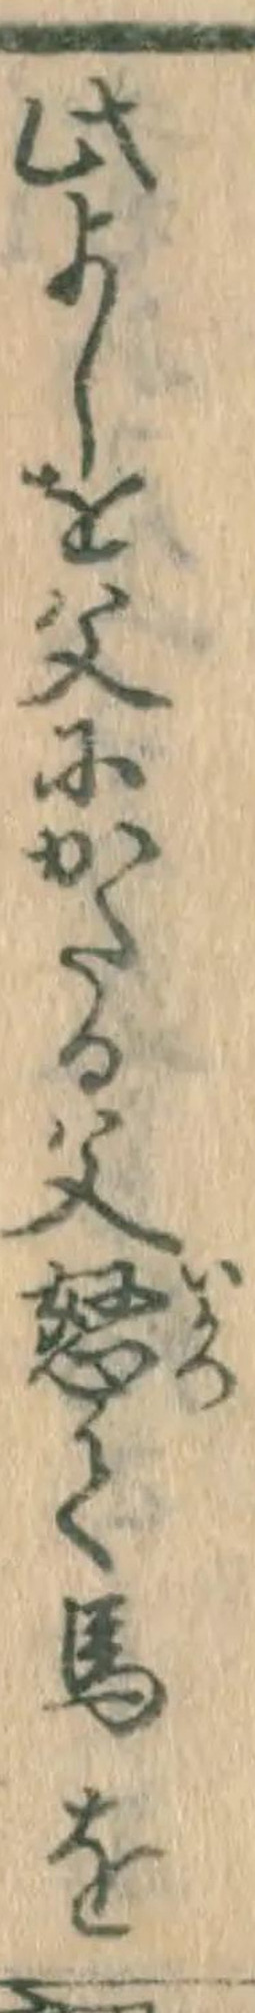此よしを父にかたる父怒て馬を
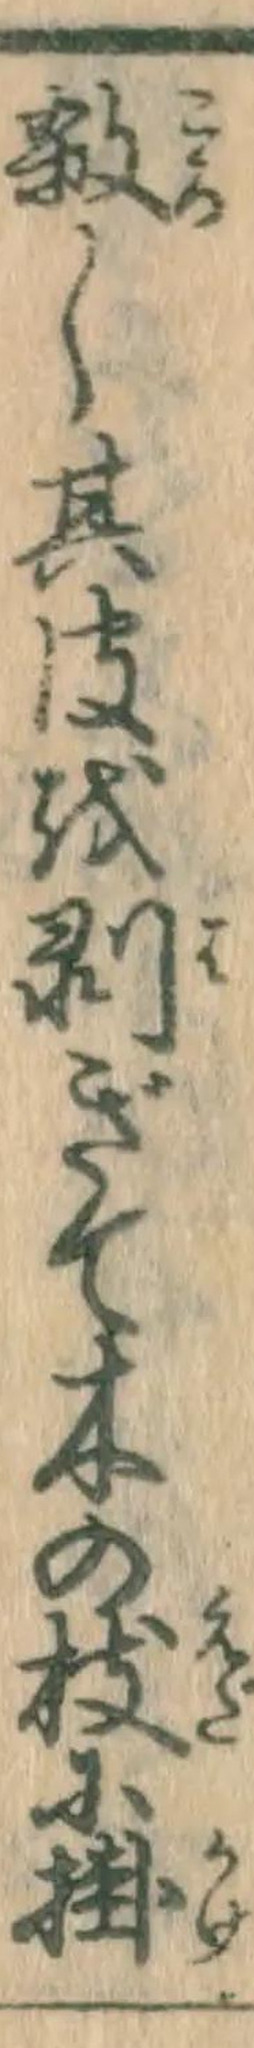殺し其皮を剥ぎて木の枝に掛
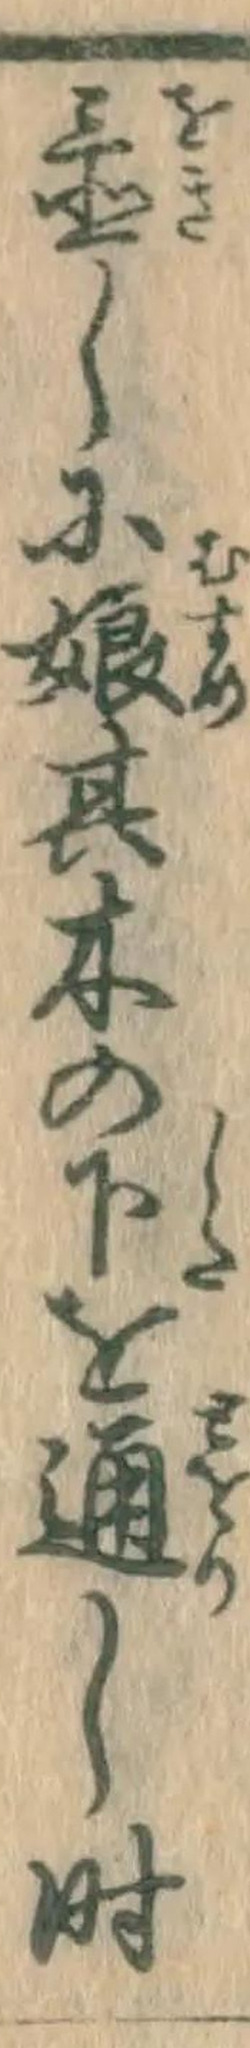置しに娘其木の下を通し時
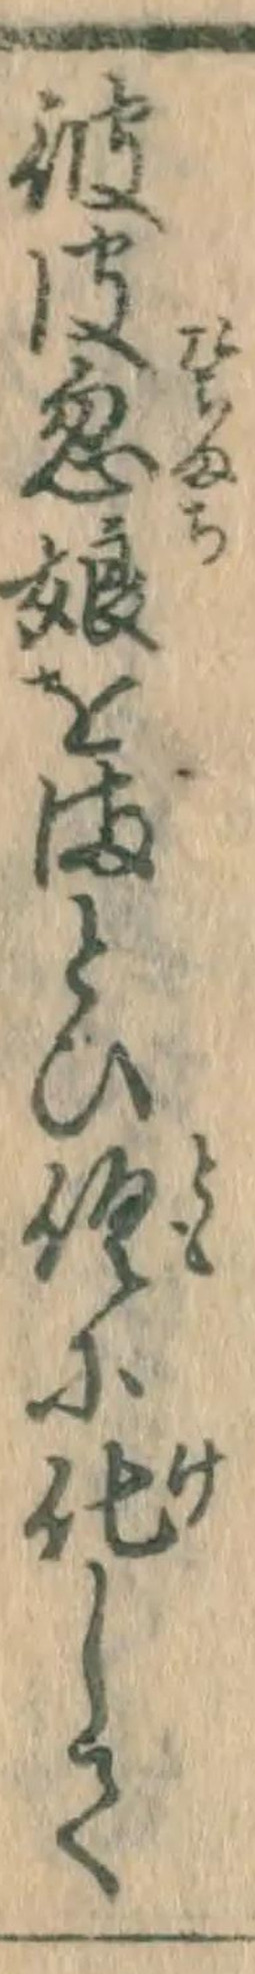彼皮忽娘をまとひ倶に化して
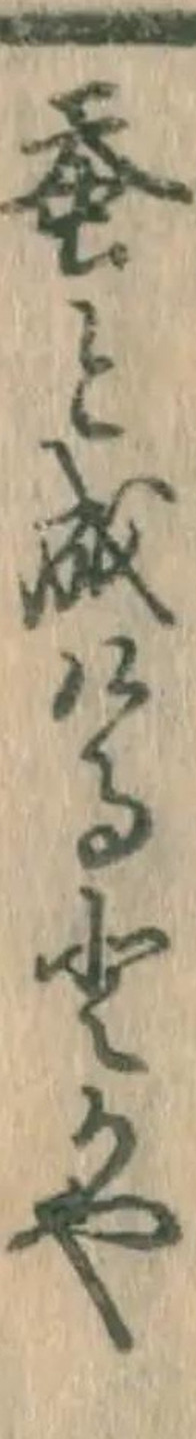蚕と成けるとかや
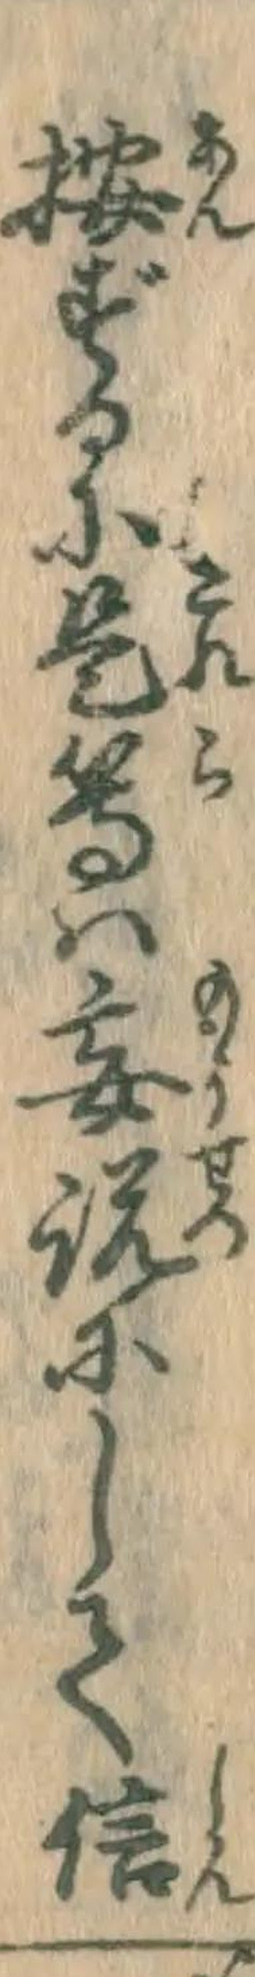按ずるに是等は妄説にして信
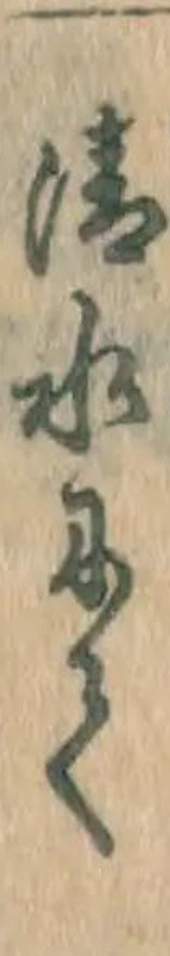清水にて
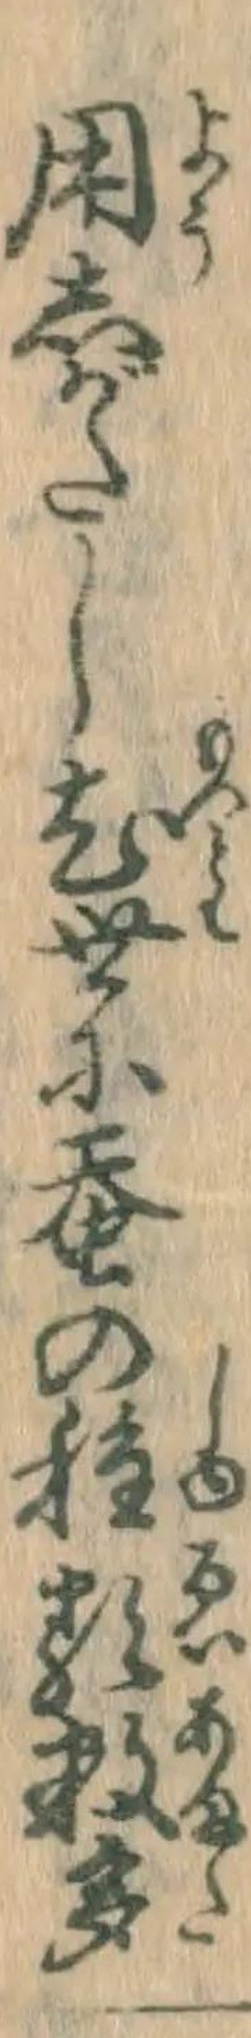用しがたし尤世に蚕の種類数多
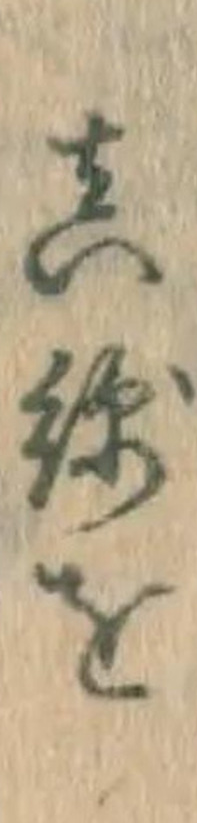真綿を
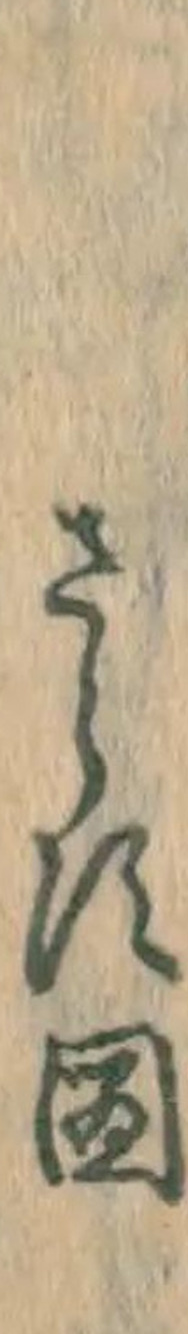さらす図
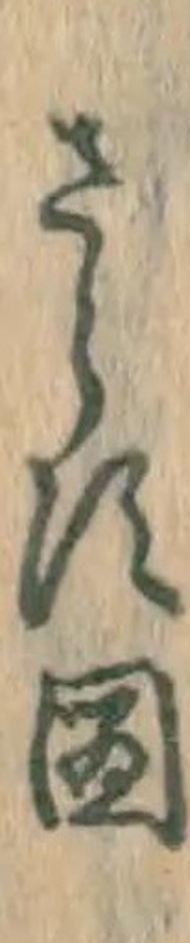さらす図
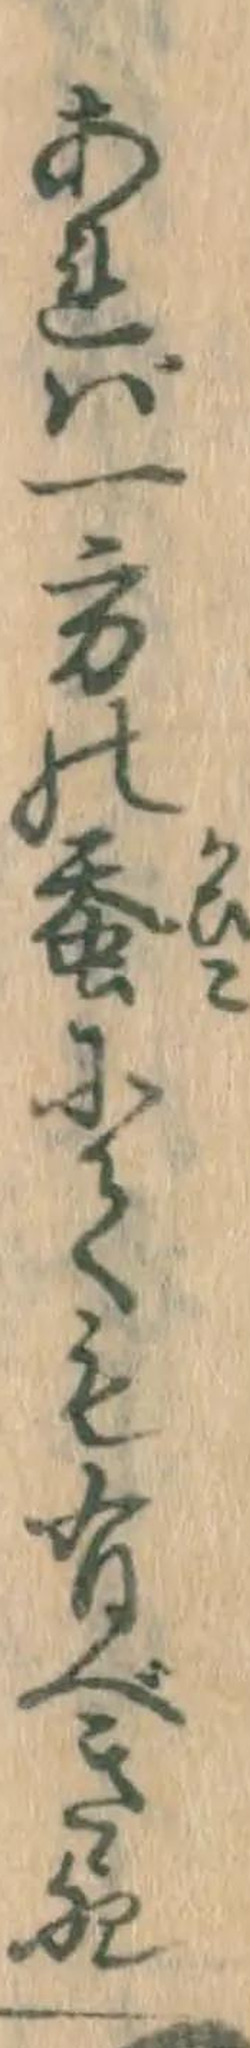あれば一方の蚕にても有べき歟
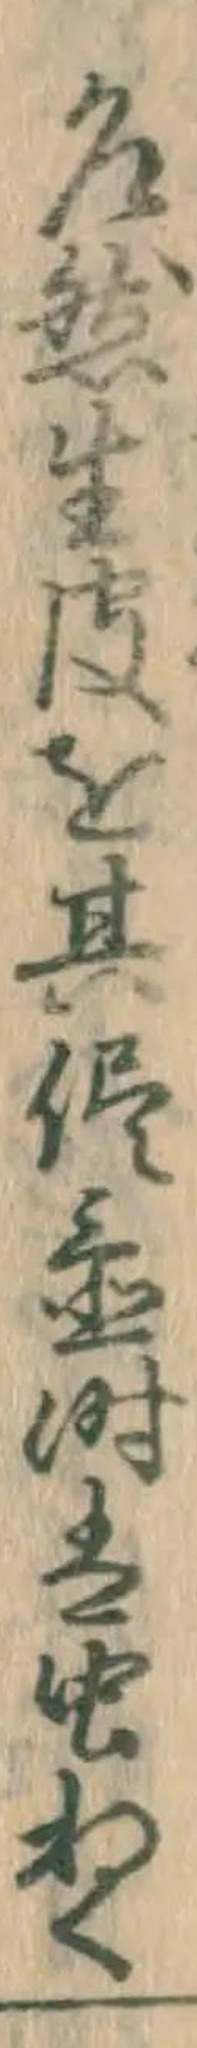乍然生皮を其侭置時は虫わく
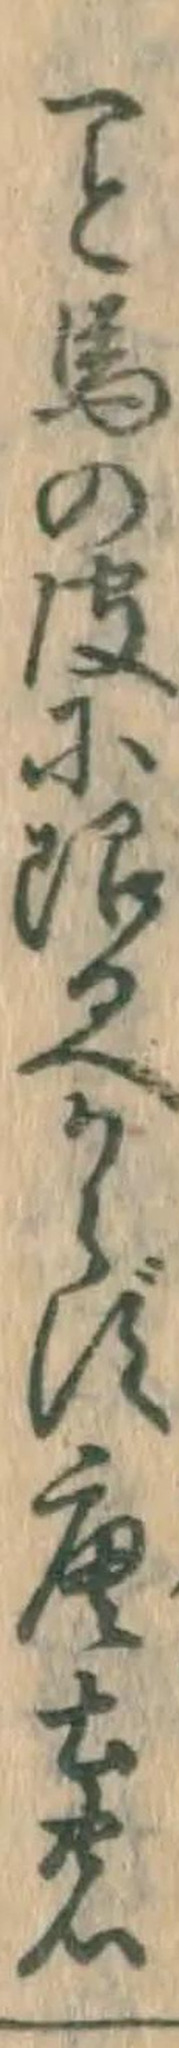こと馬の皮に限るべからず唐土の
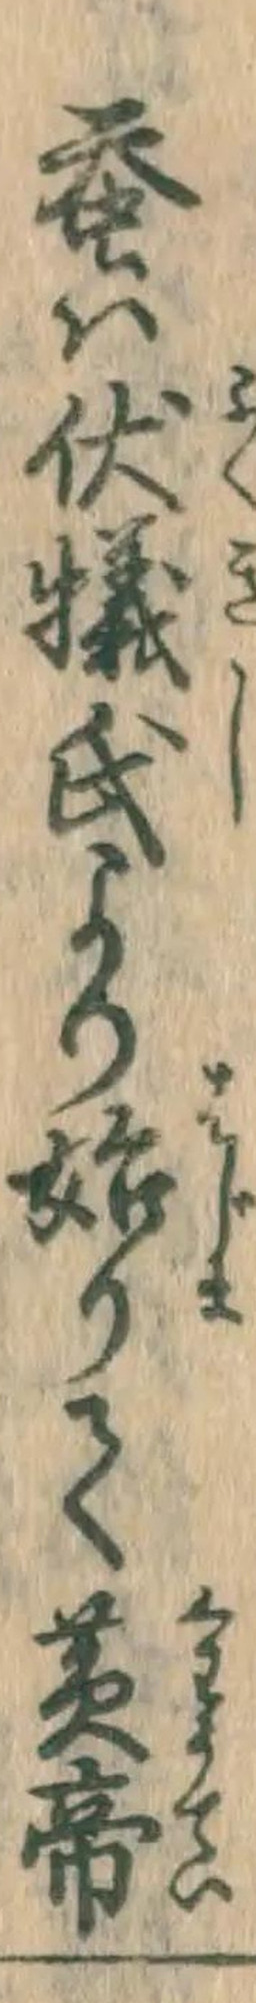蚕は伏犠氏より始りて黄帝
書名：養蚕秘録 3巻. [3]
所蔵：国立国会図書館 National Diet Library, JAPAN
